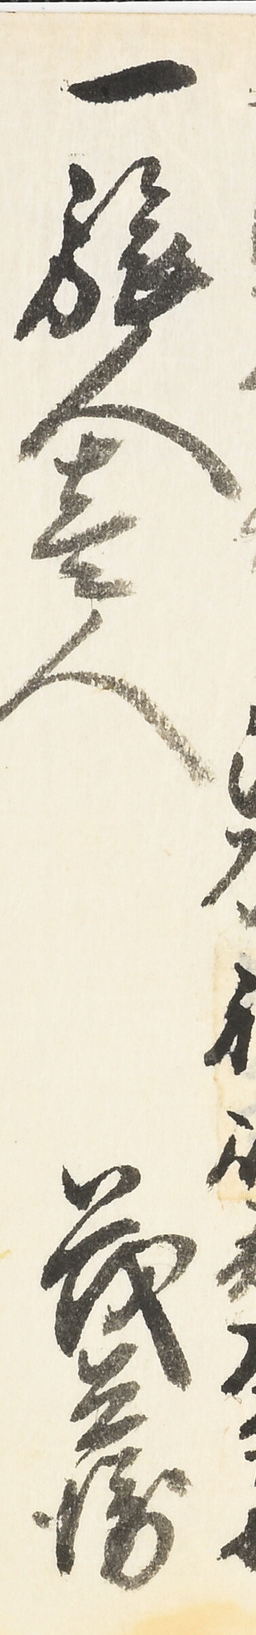一旅人壱人茂兵衛
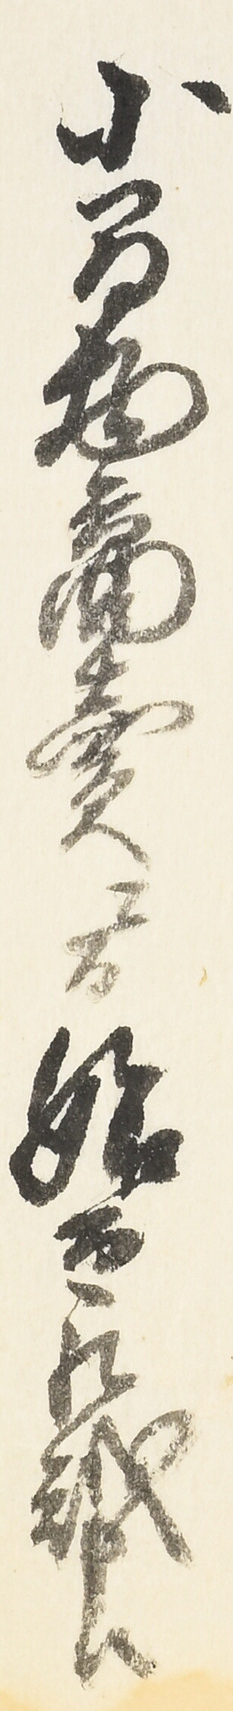小間物商売ニ而始而罷越申候
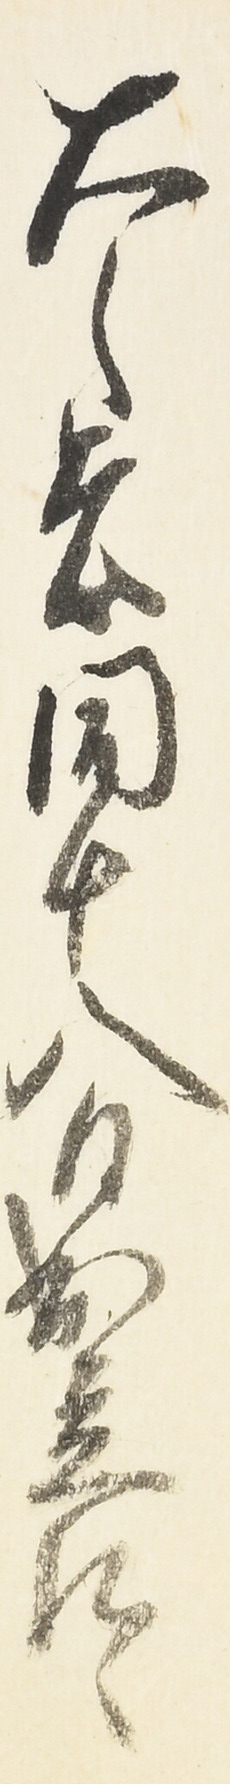右之者同十八日出立仕候
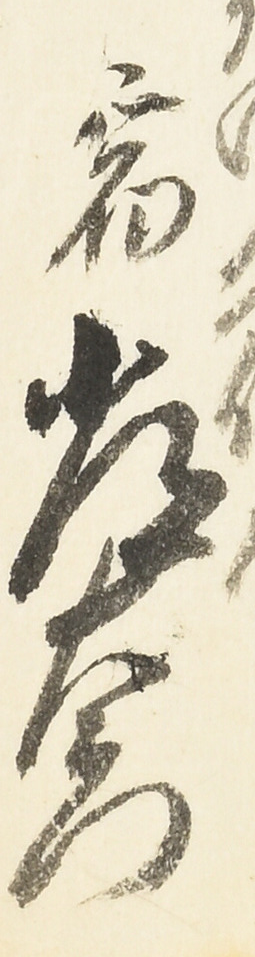宿常右衛門
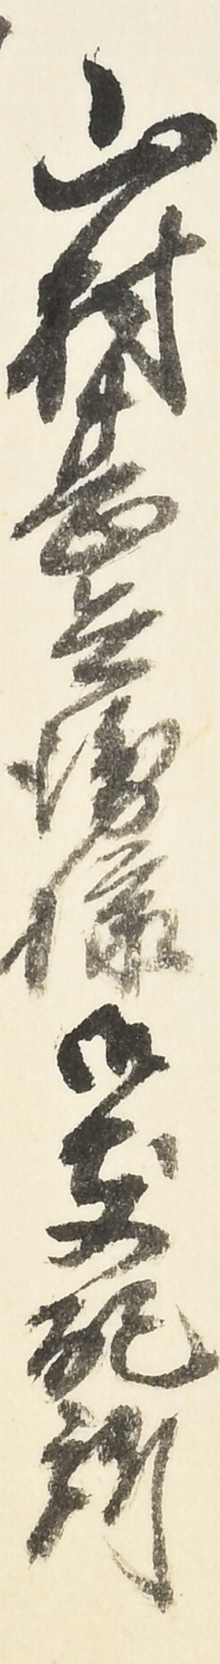山村甚兵衛様御支配所
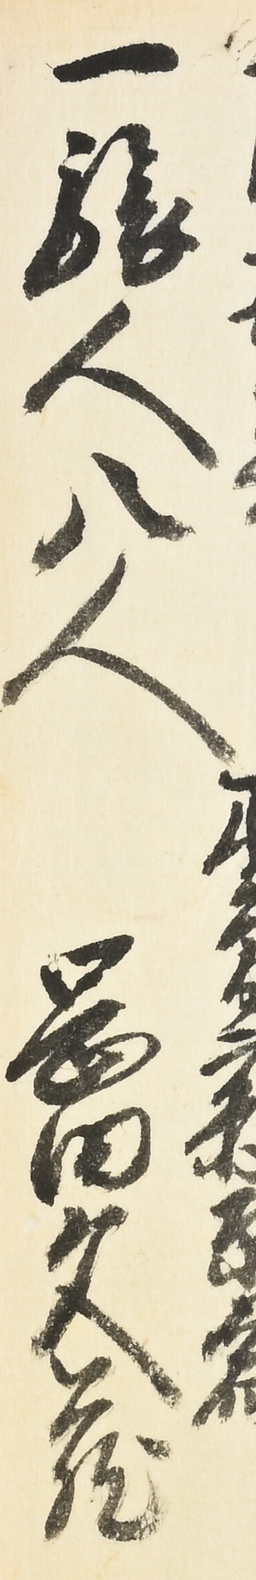一旅人八人岡田文蔵
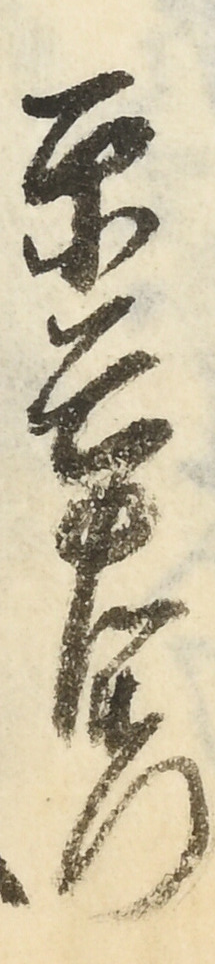宿常右衛門

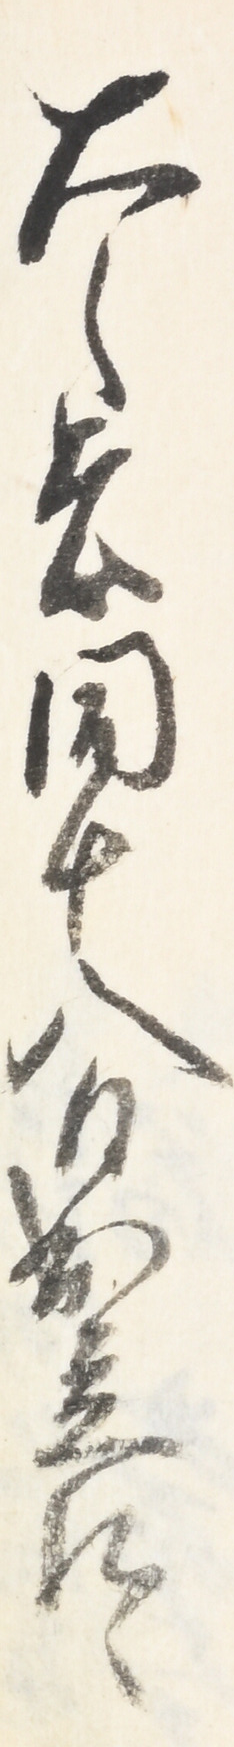右之者共同十八日出立仕候
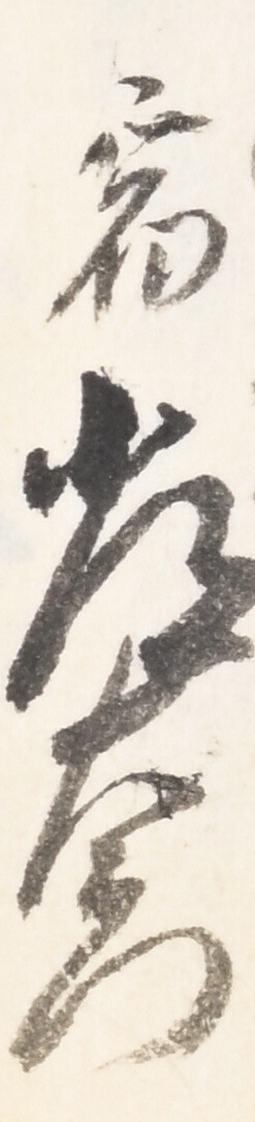原兵右衛門
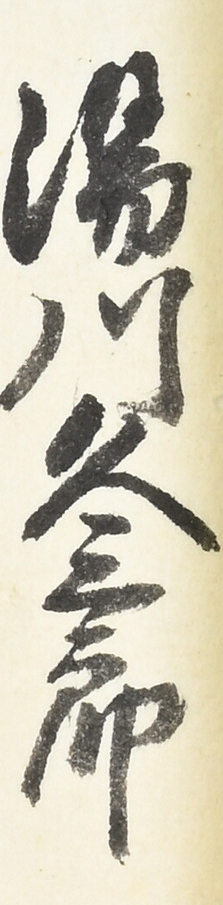湯川久三郎
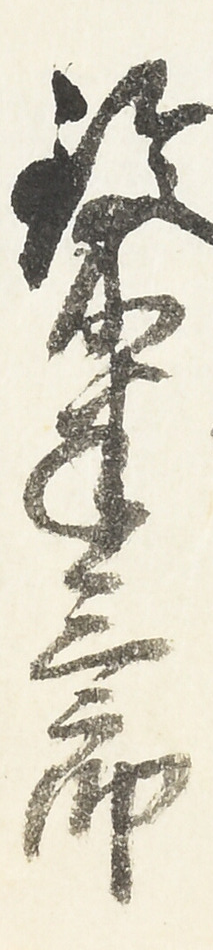鈴木半三郎
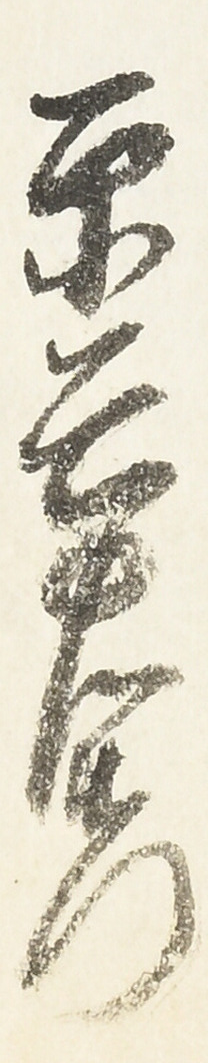原兵右衛門
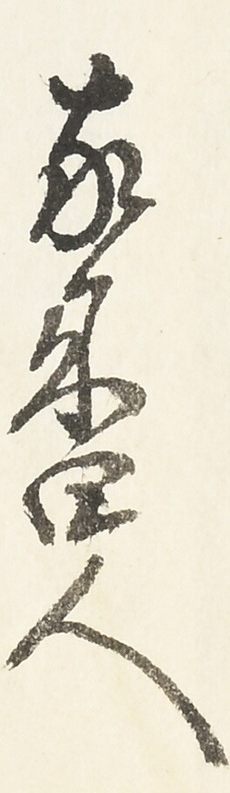家来四人
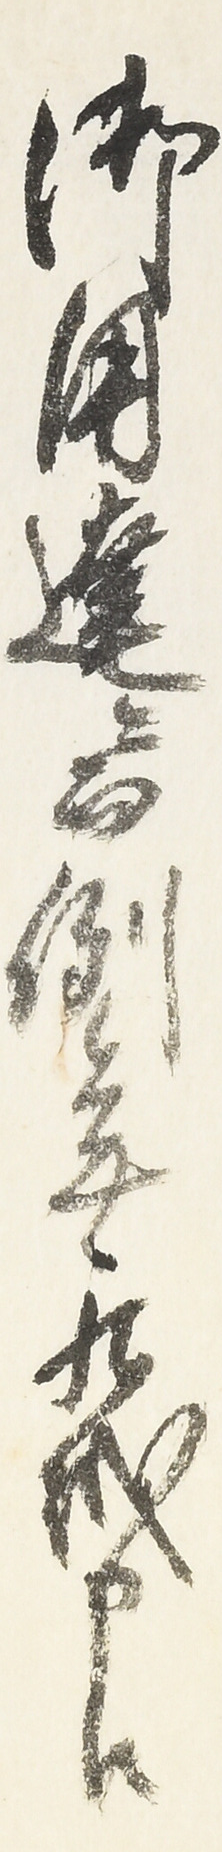御用達ニ而例年罷越申候
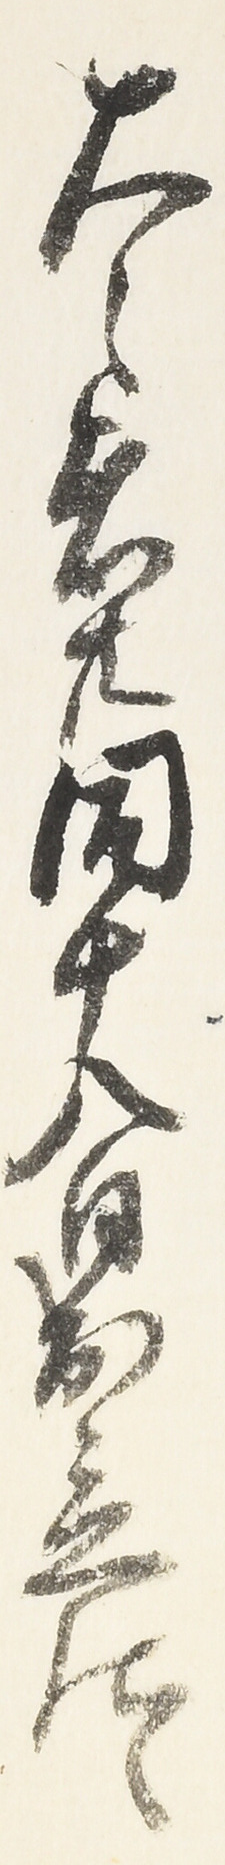右之者共同十八日出立仕候
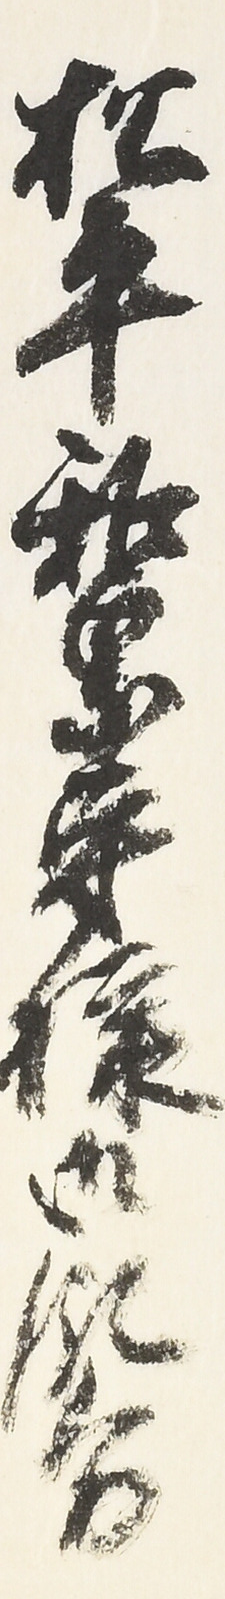松平和泉守様御領分
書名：町中旅人泊控帳
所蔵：伊那市立高遠町図書館・合同会社AMANE
